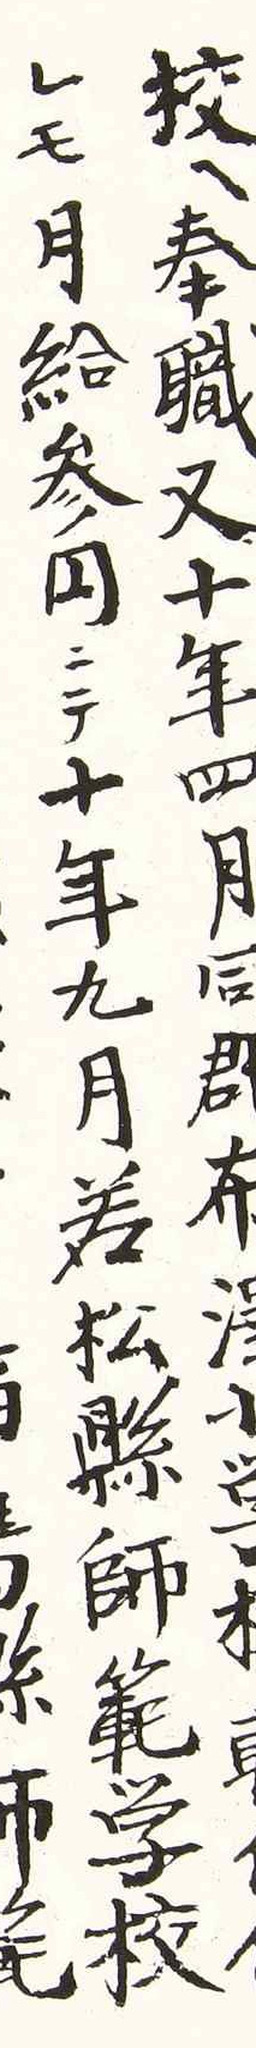レモ月給参円ニテ十年九月若松県師範学校
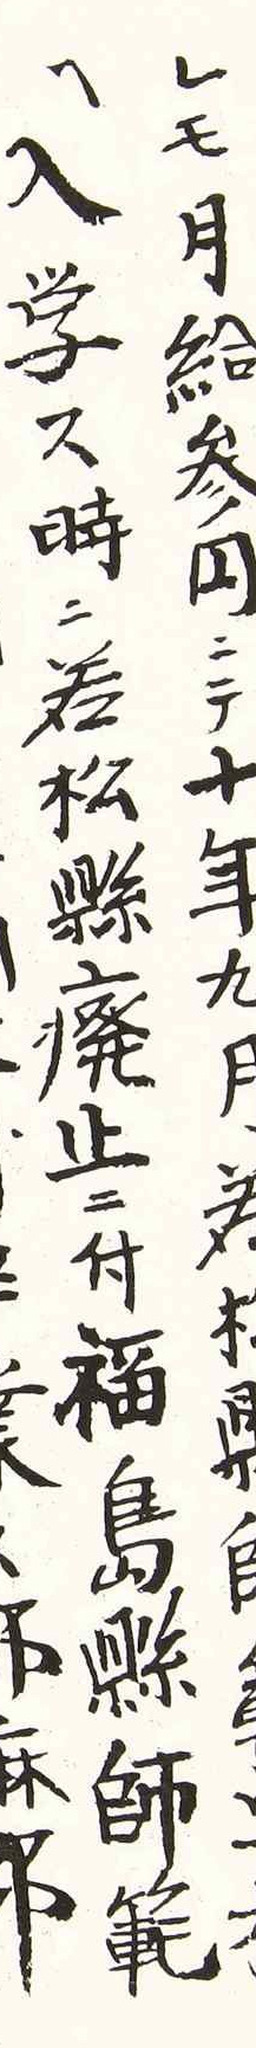へ入学ス時ニ若松県廃止ニ付福島県師範
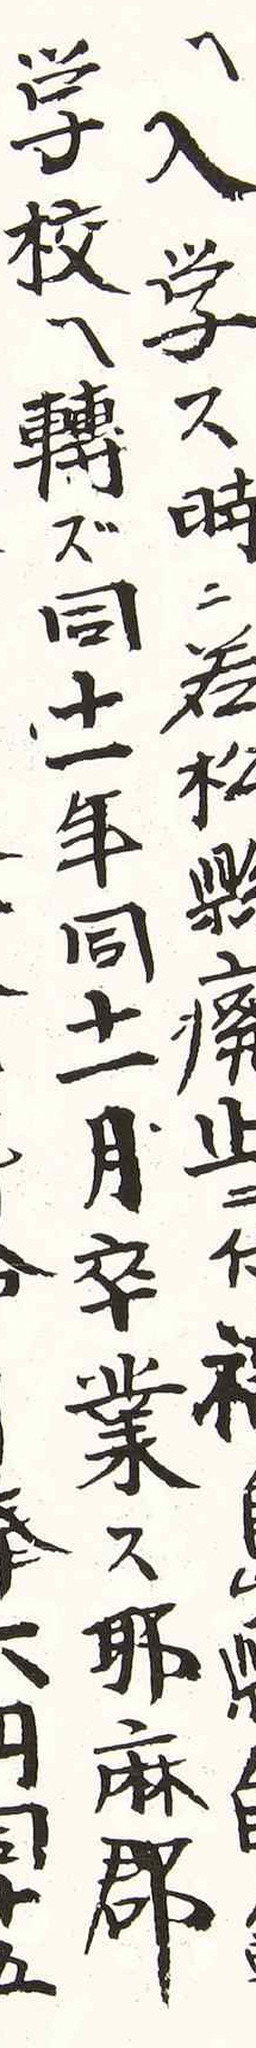学校へ転ズ同十一年同十一月卒業ス耶麻郡
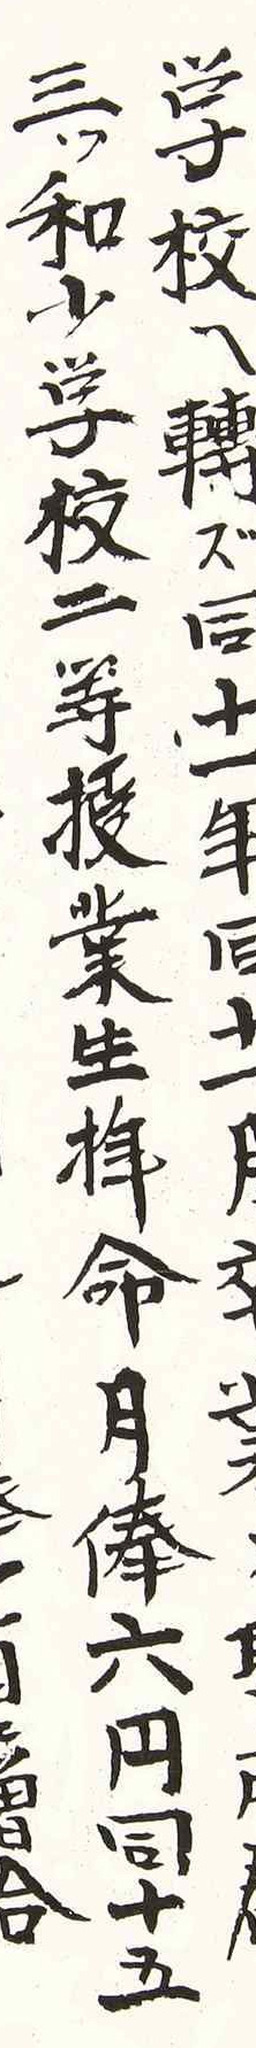三ツ和小学校二等授業生拝命月俸六円同十五
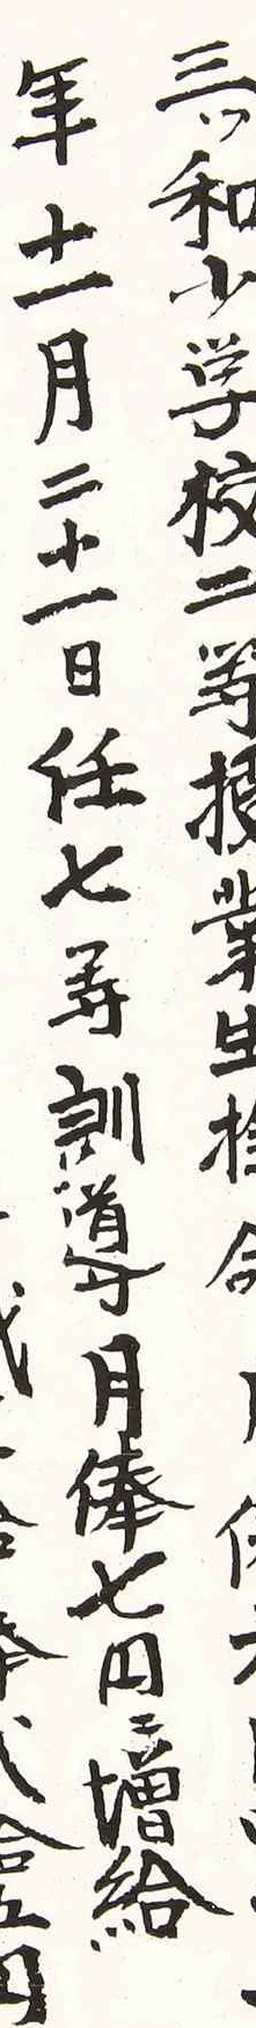年十一月二十一日任七等訓導月俸七円ニ増給
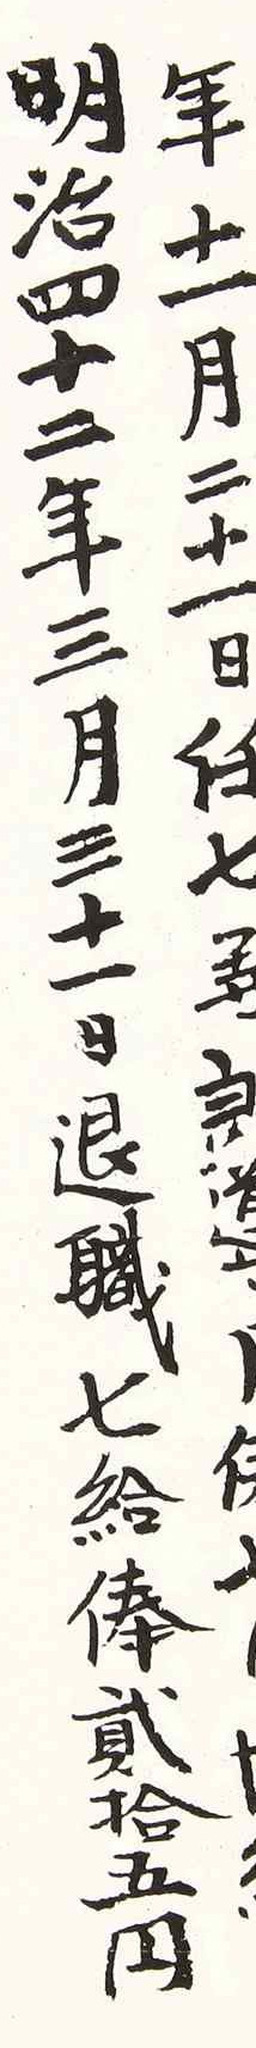明治四十二年三月三十一日退職七給俸弐拾五円
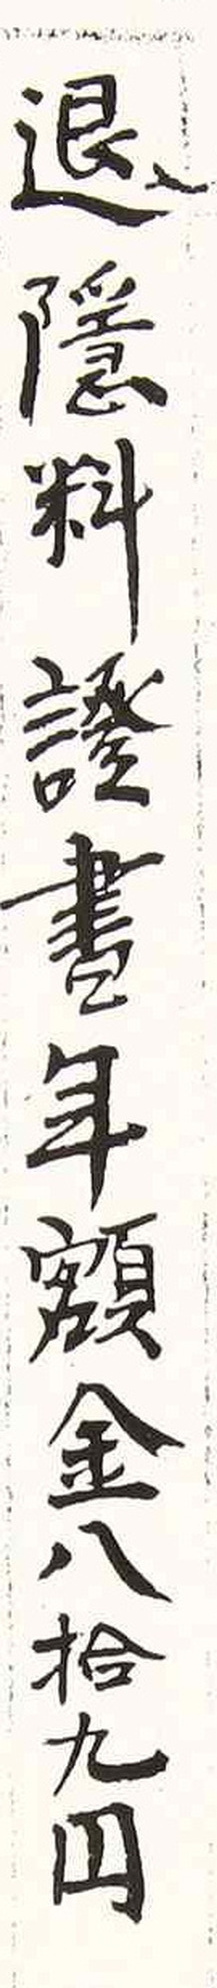退隠料証書年額金八拾九円
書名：諸士系譜　巻之357　す之部7
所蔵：会津若松市立会津図書館
